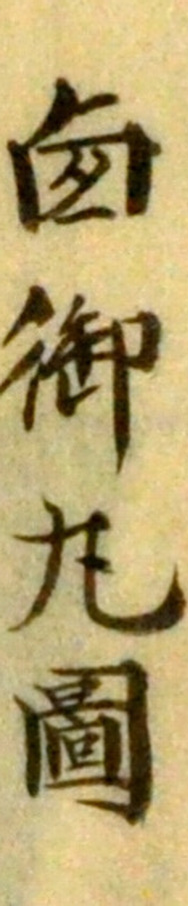西御丸図

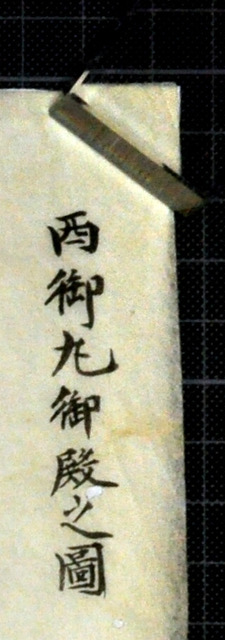西御丸御殿之図
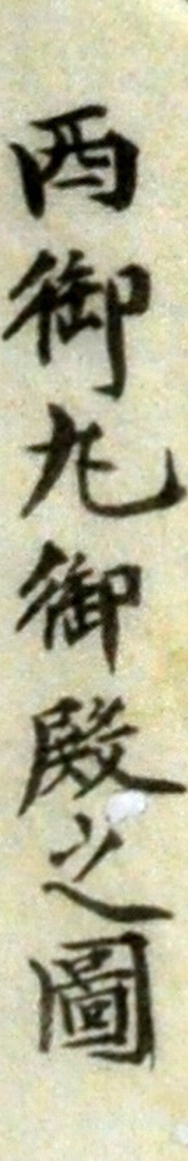西御丸御殿之図

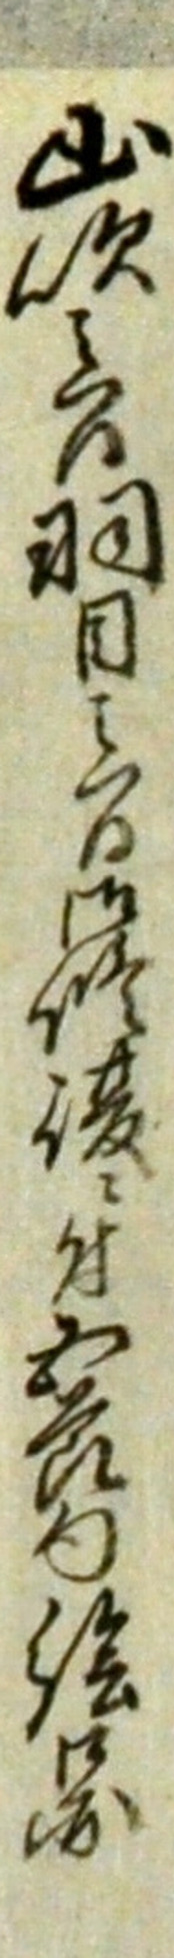山吹之間羽目之間御修復ニ付五節句絵図

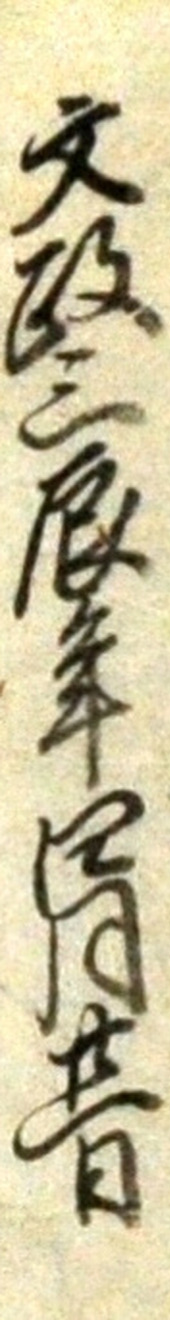文政三辰年四月廿一日

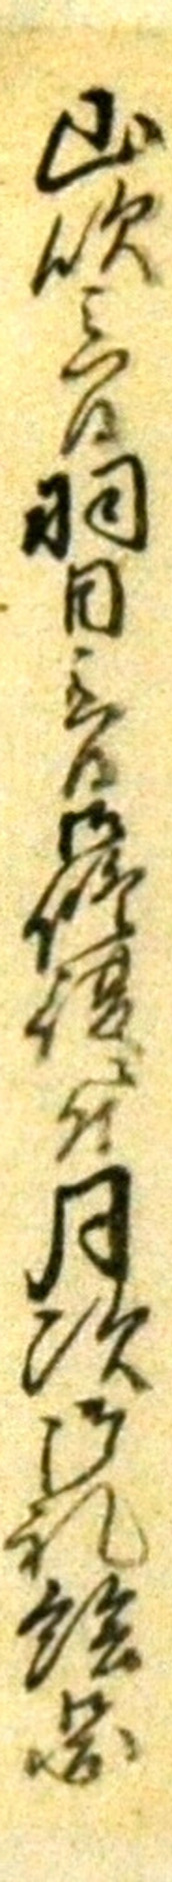山吹之間羽目之間御修復ニ付月次御礼絵図

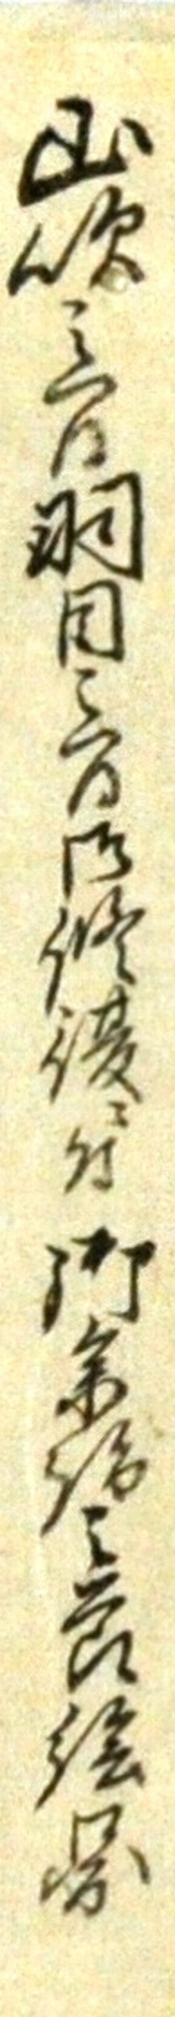山吹之間羽目之間御修復ニ付御参詣之節絵図

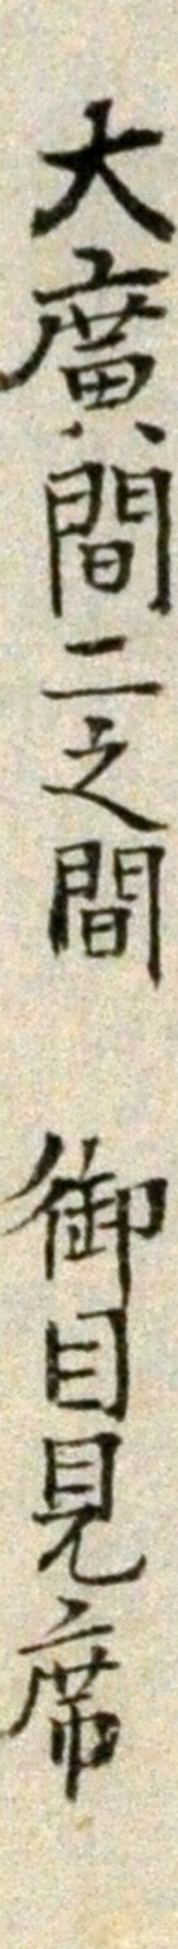大広間二之間御目見席壱

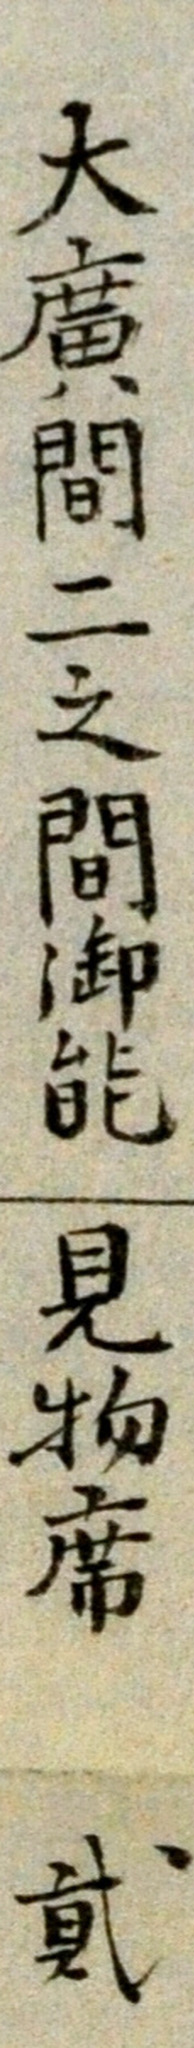大広間二之間御能見物席弐

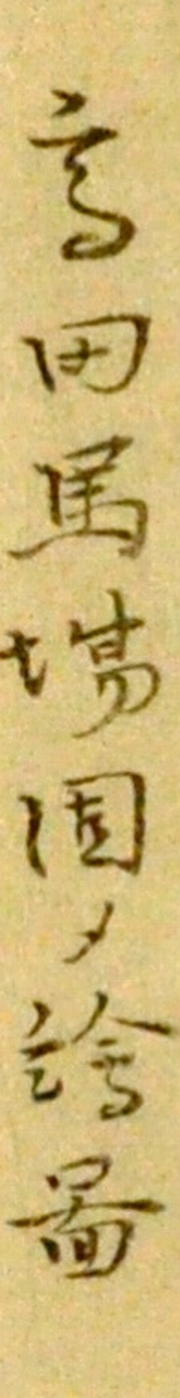高田馬場固メ絵図
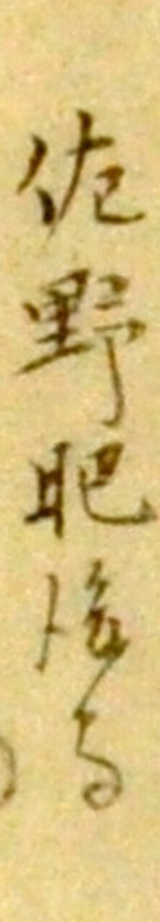佐野肥後守
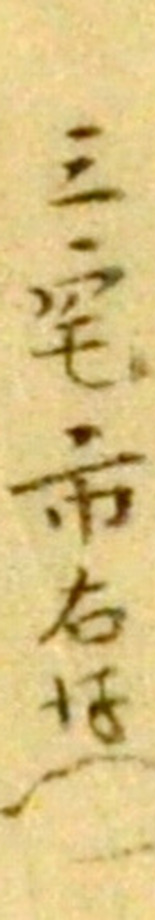三宅市右衛門

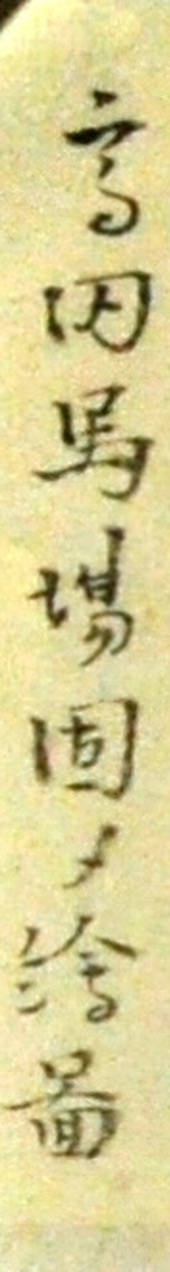高田馬場固メ絵図

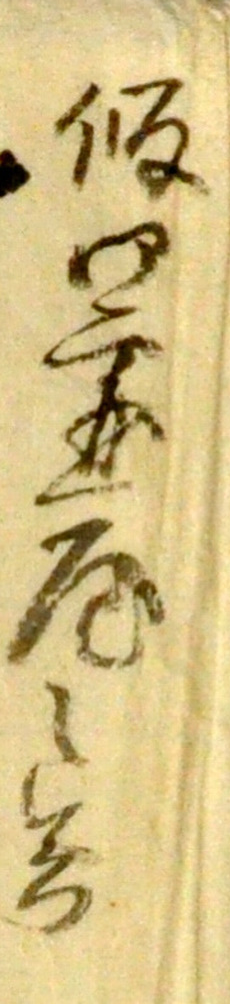仮御霊屋之図

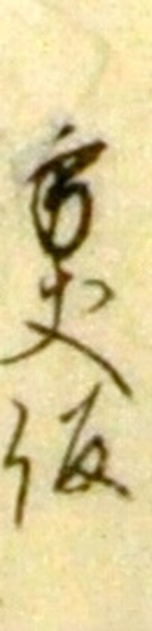方丈仮

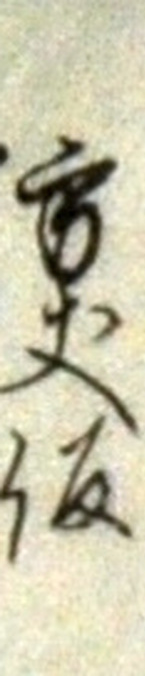方丈仮
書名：諸絵図面〔一括〕
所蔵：伊那市立高遠町図書館・合同会社AMANE
